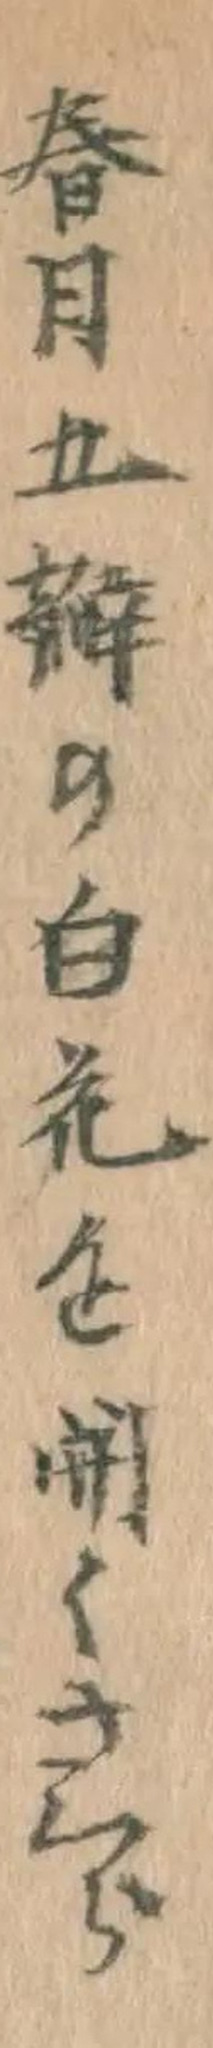春月五弁の白花を開くさくら
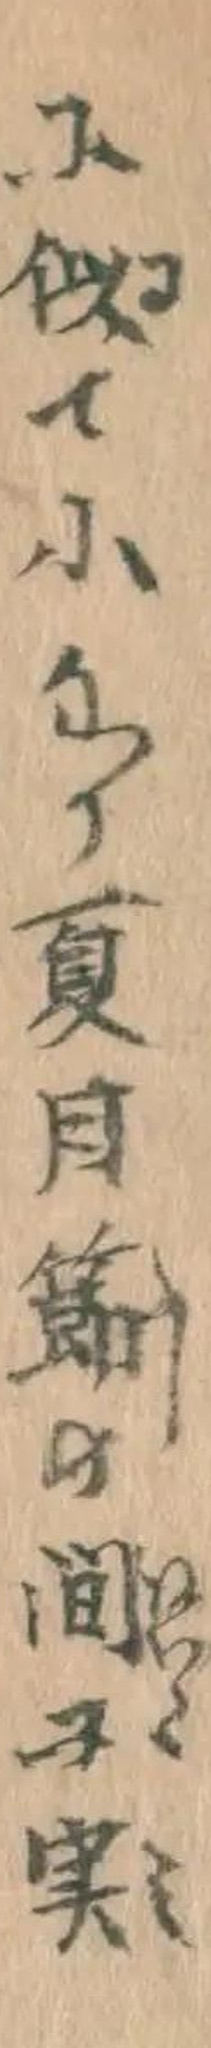に似て小なり夏月節の間に実
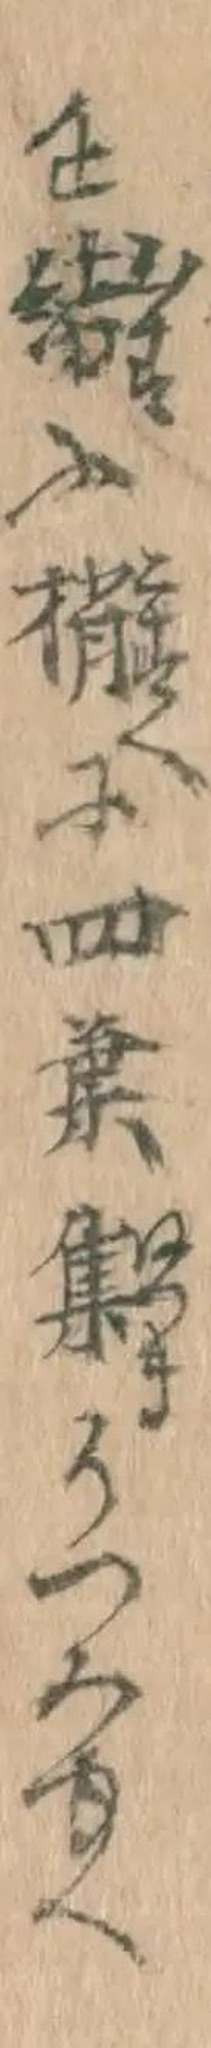を結ふ梢に四葉集りつくゆへ
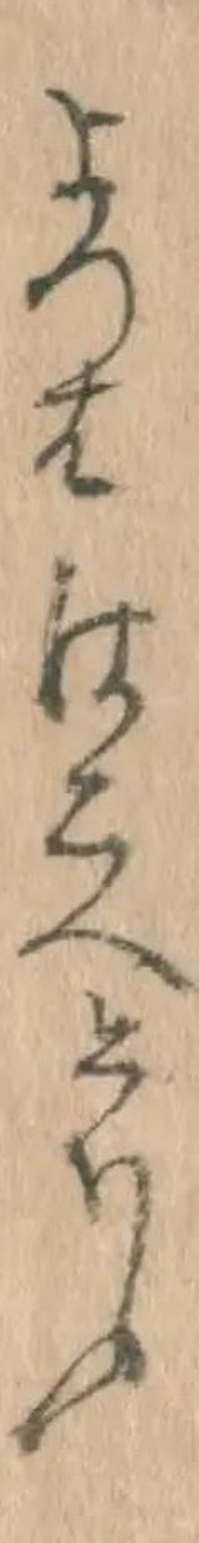よつははこへといふ

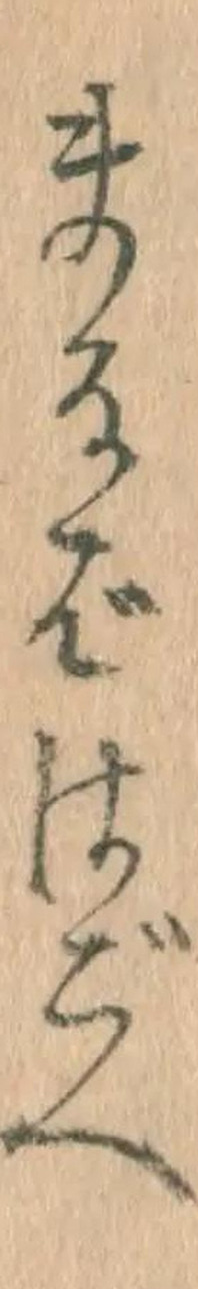まるばはごへ
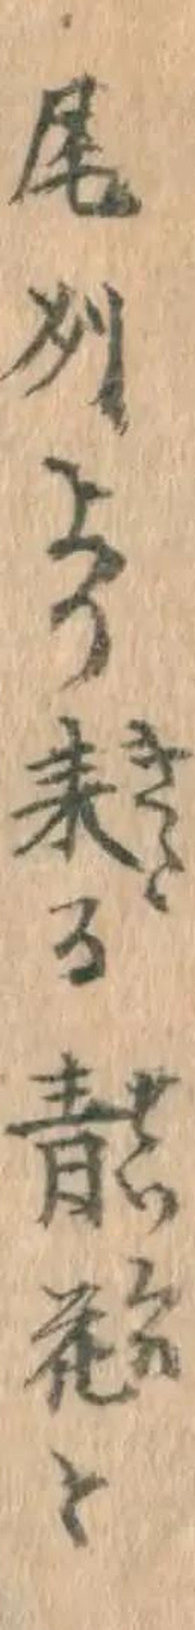尾州より来る青花と
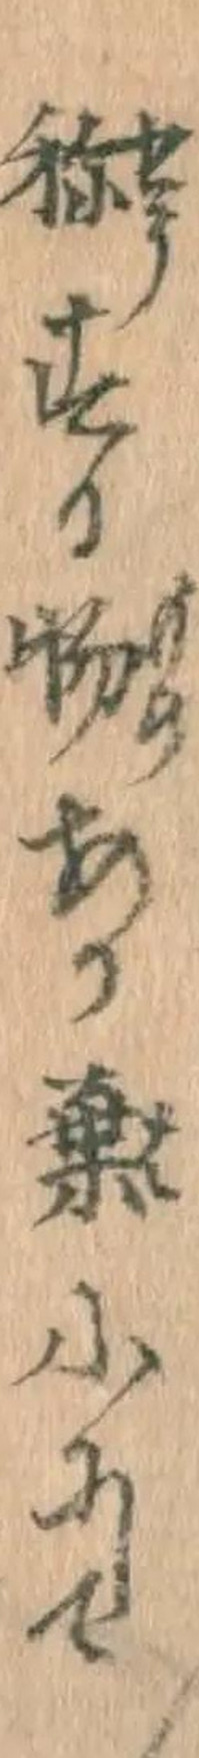称する物あり葉小にして
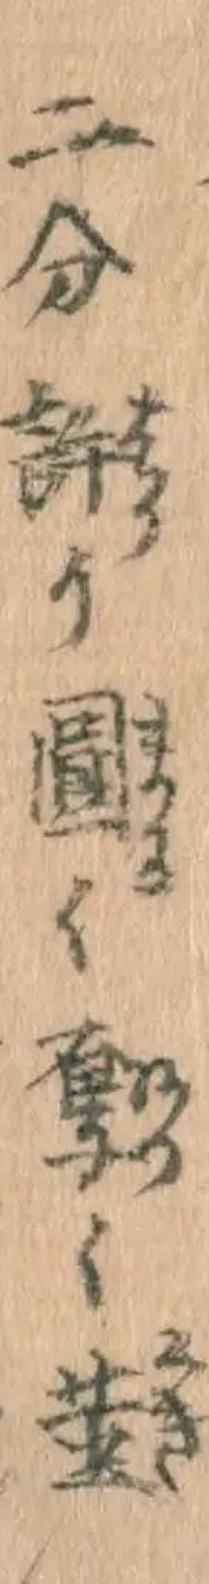二分許り円く厚く茎
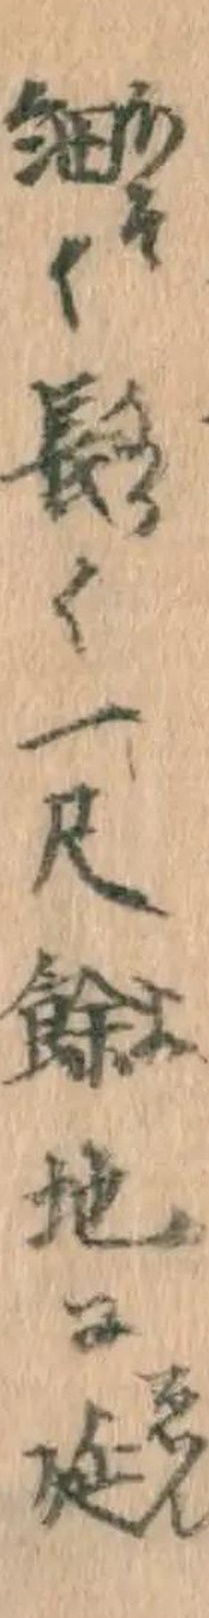細く長く一尺余地に延
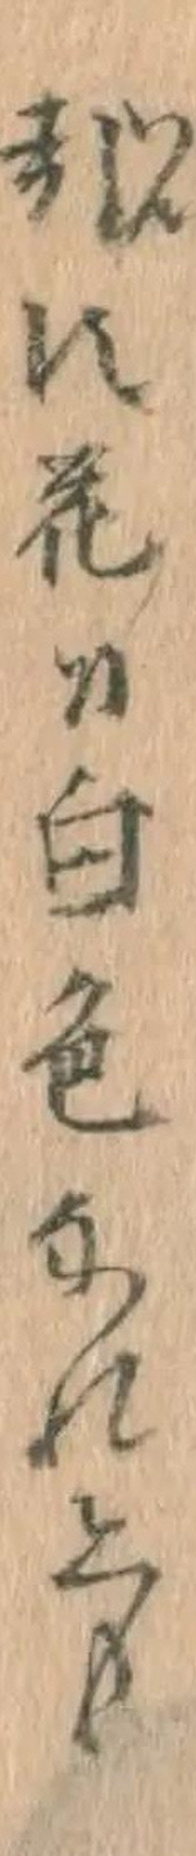引す花は白色なれとも
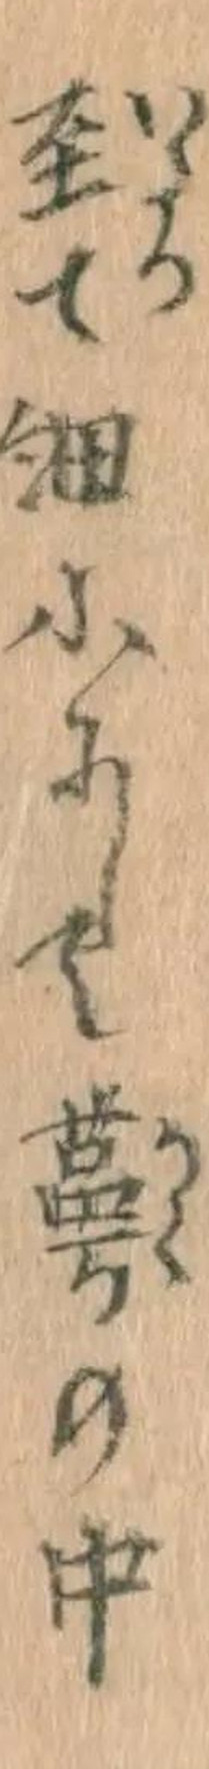至て細小にして萼の中
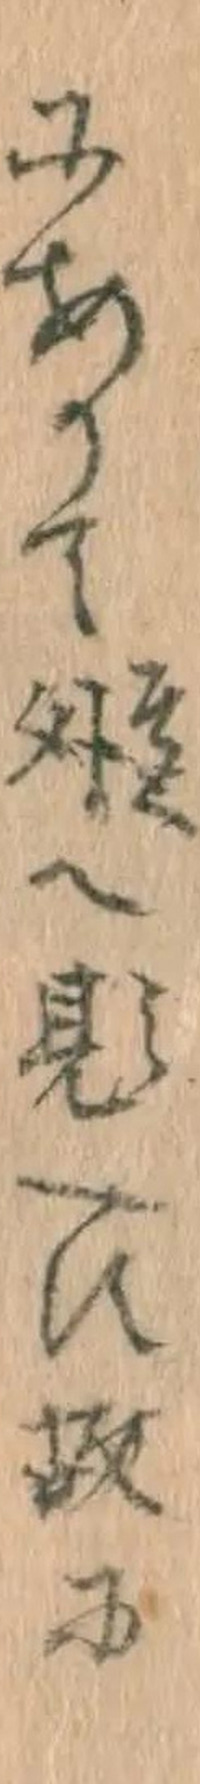にありて外へ見へす故に
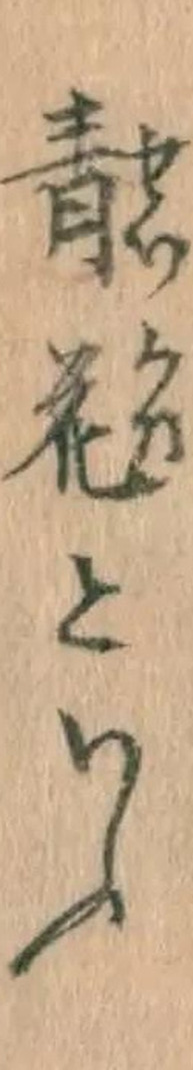青花といふ
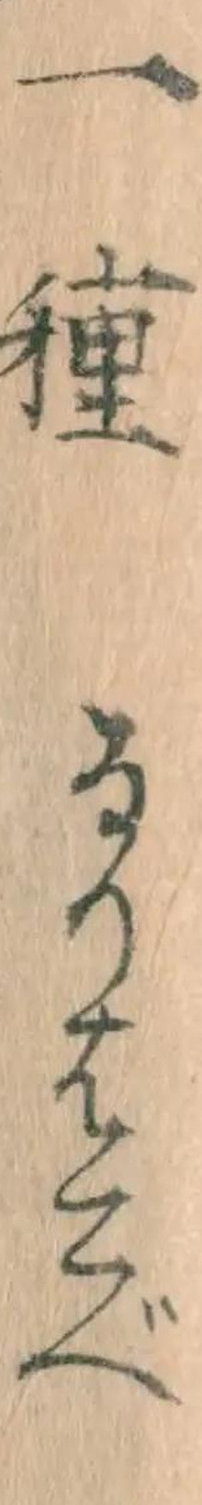一種るりはこべ
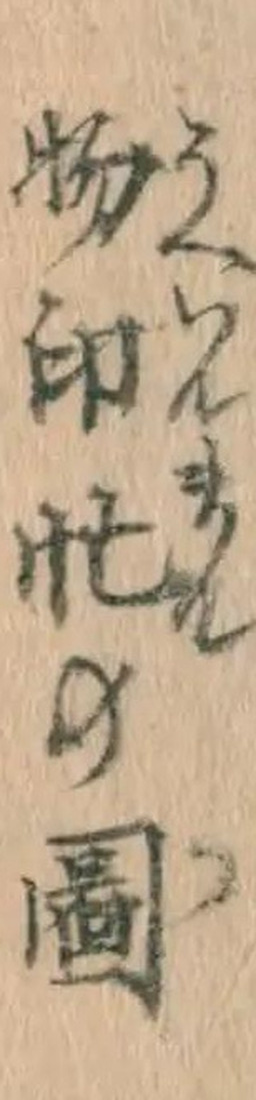物印忙の図

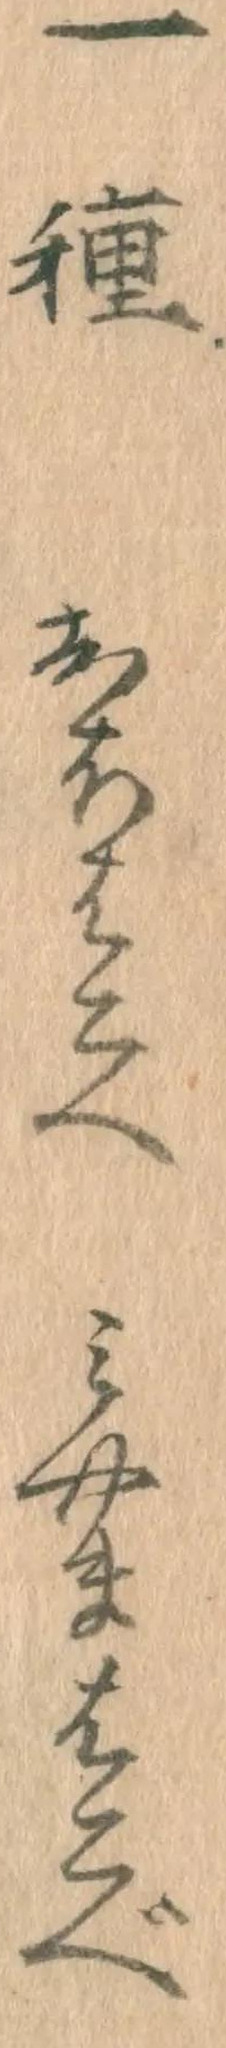一種おほはこへみやまはこべ
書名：本草図譜. 巻46-48
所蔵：国立国会図書館 National Diet Library, JAPAN
